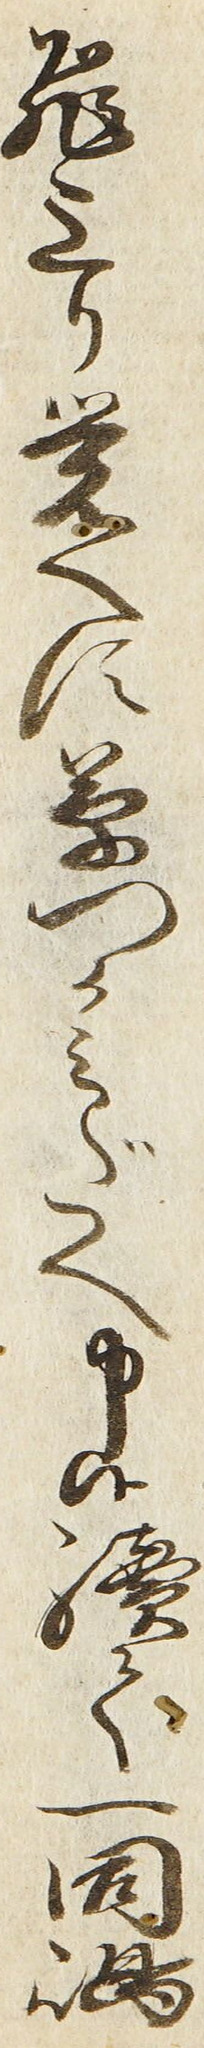飛上り覚へす草つかみごへ申候續て一同嶋
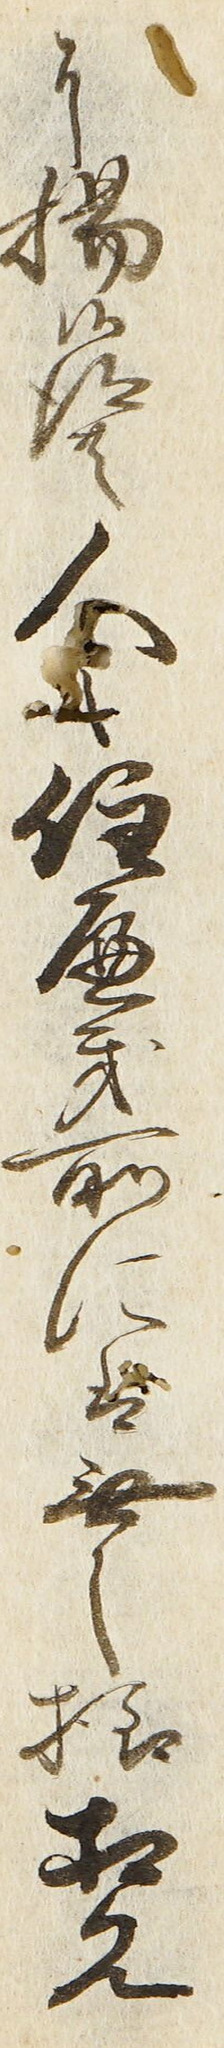に揚候得共人之住へき所には無之様相見
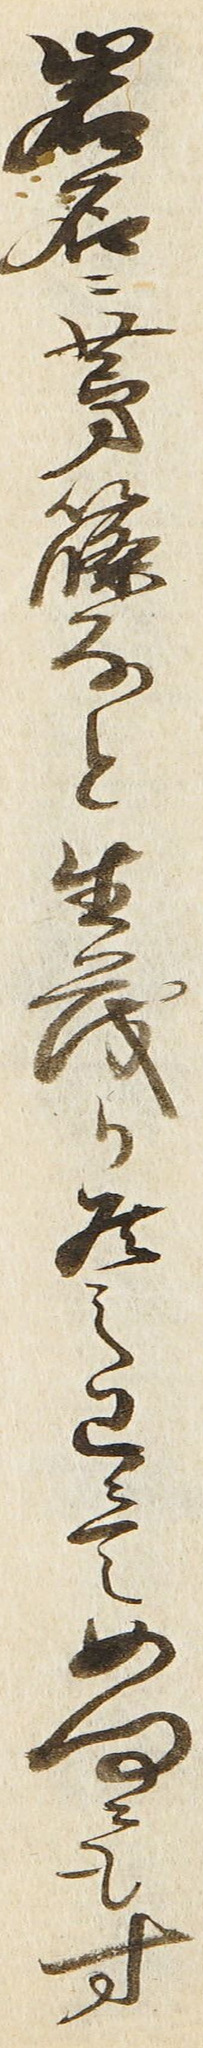岩各ニ茅篠なと生茂り候之みニて如何ニもす
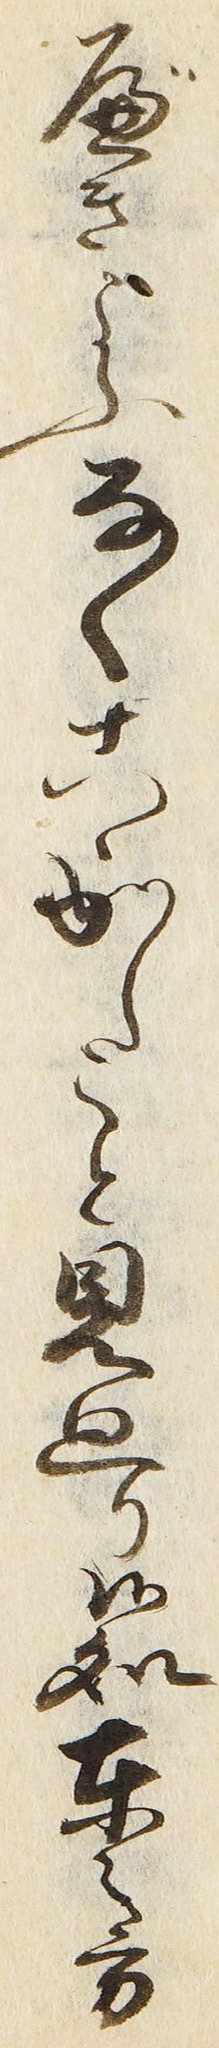べきよふなくこゝかしこと見廻り候処東之方
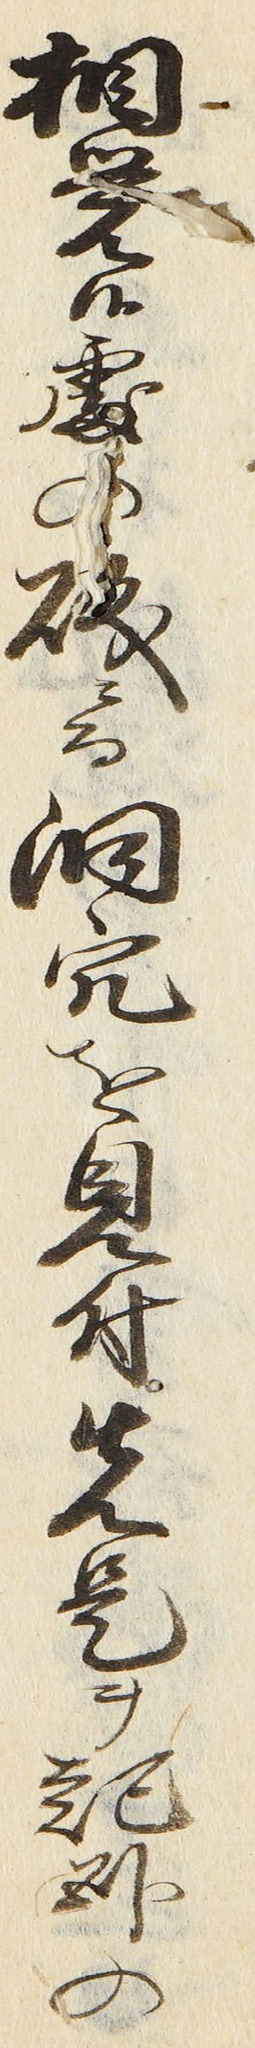相覚候處の磯ニ而洞穴を見付先是ヲ起臥の
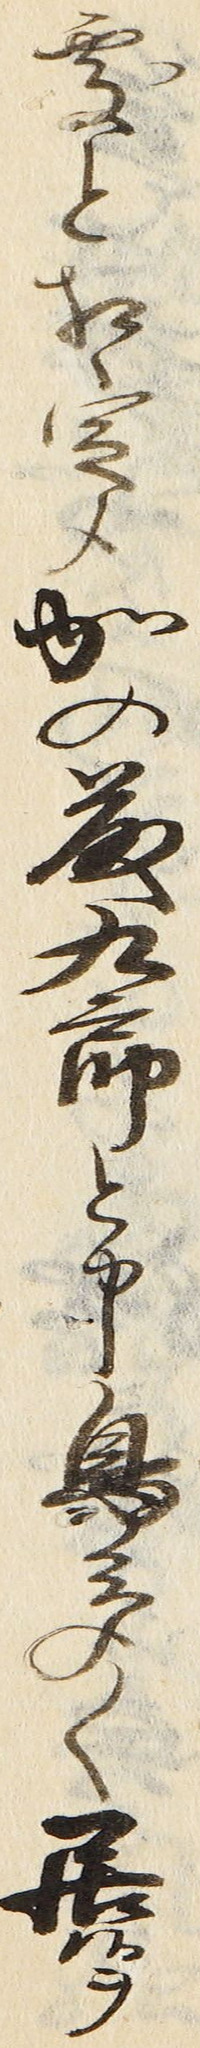處と相定メかの藤九郎と申鳥多く居候ヲ
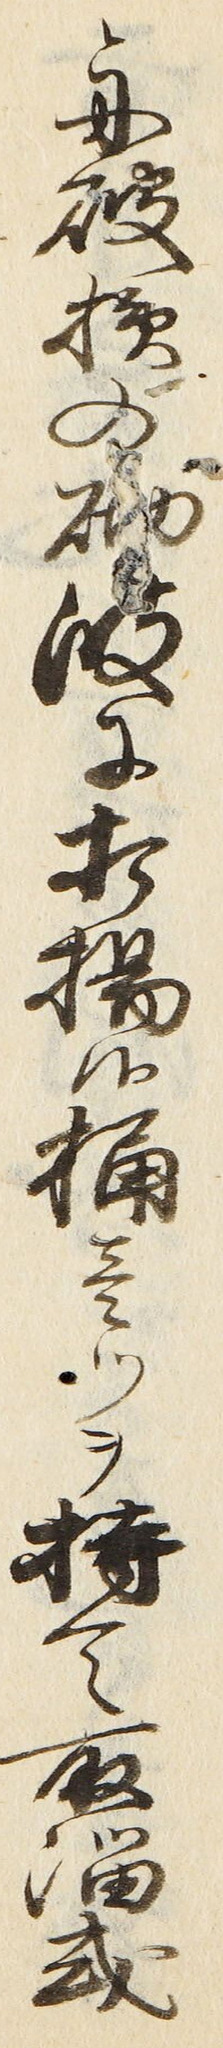舟破損の砌波に打揚候桶壱ツヲ持て取溜或
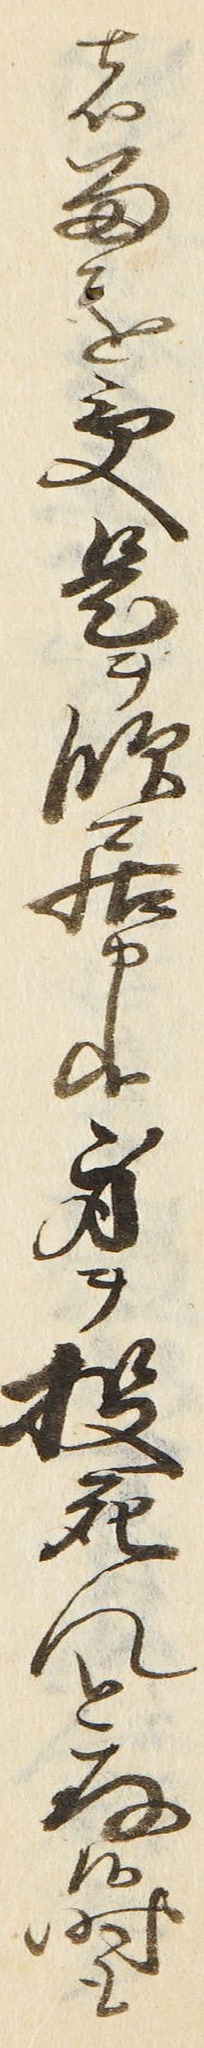者雨を受是ヲ飲居申候身ヲ投死んと存候時も
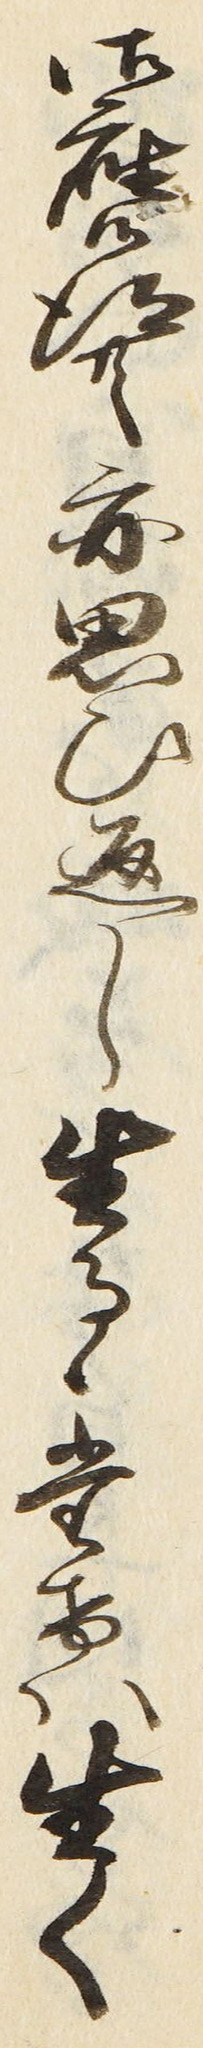御座候得共亦思ひ返し生るゝたけハ生く
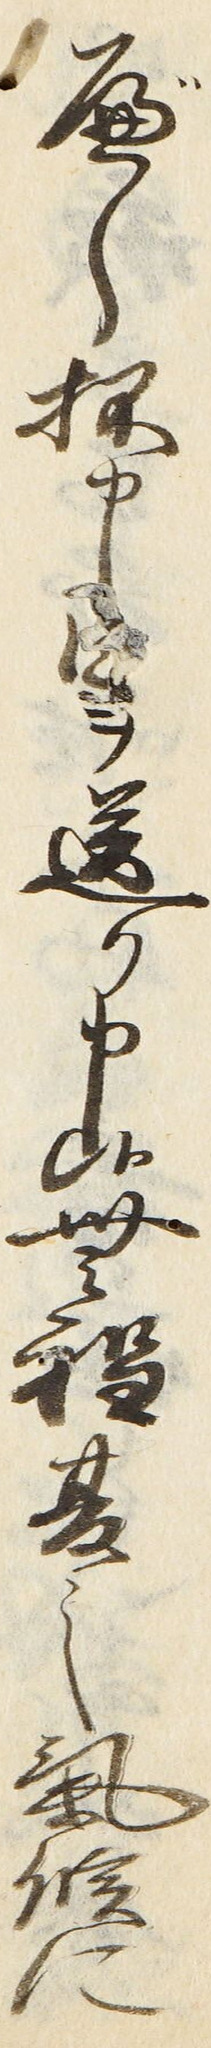べし抔申日ヲ送り申候無程夏之氣候に
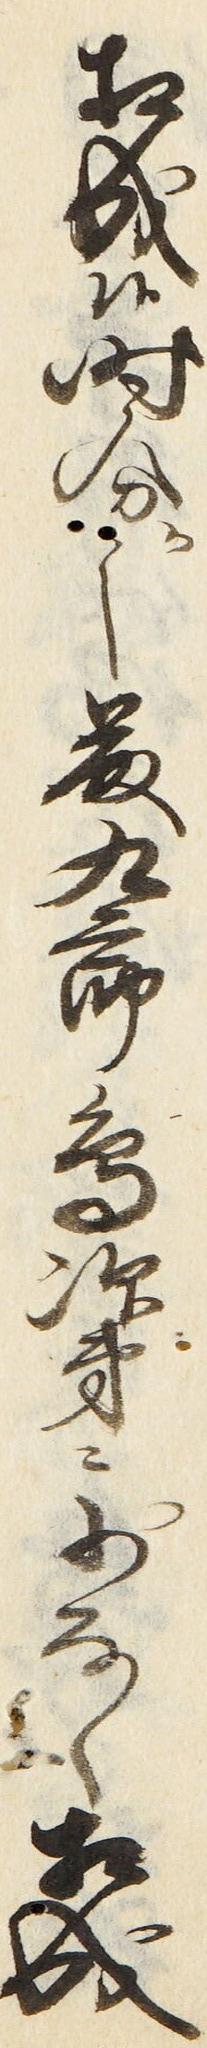相成候時分かの藤九郎鳥次第ニ少なく相成
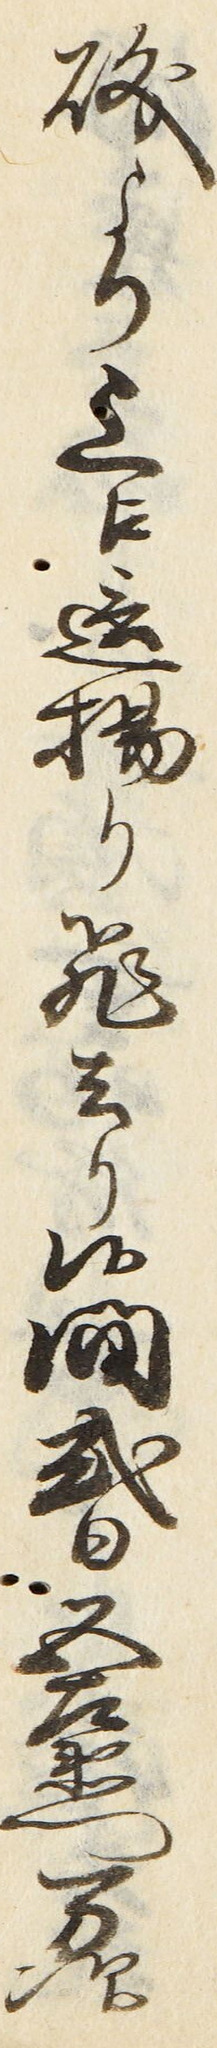磯より上江這揚り飛去り候間或日五左衛門万次
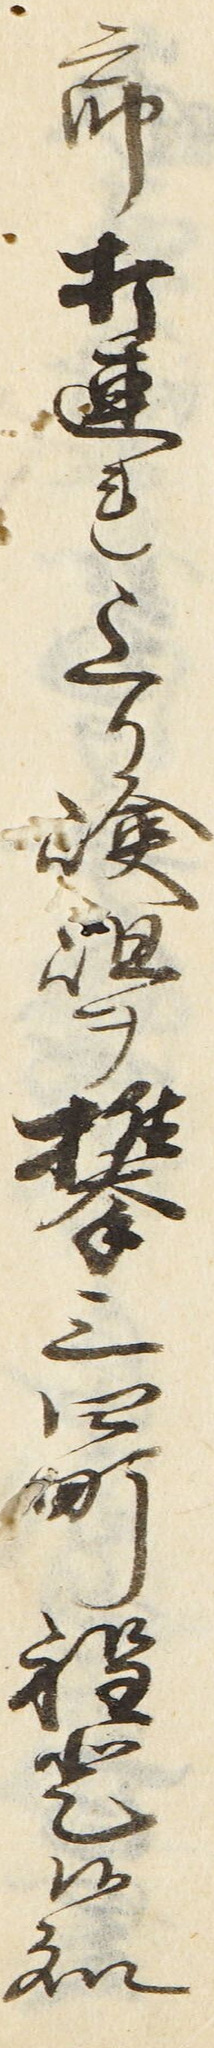郎打連れ上り嶮岨ヲ攀三四町程登候処
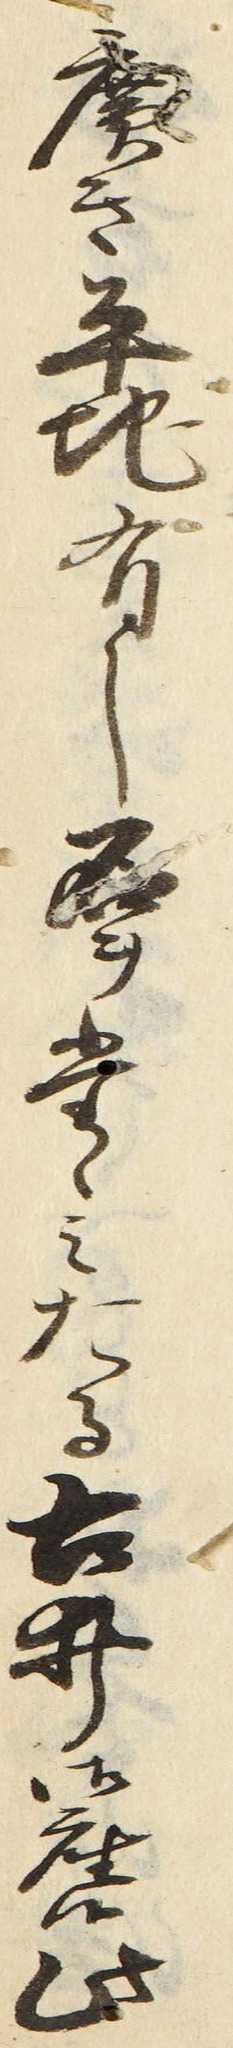廣き平地有之石をたゝミたる古井御座候此

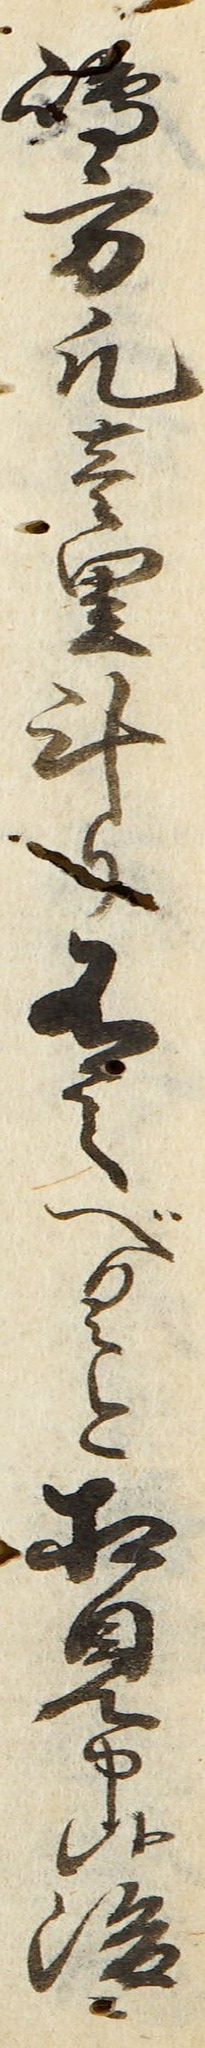嶋方凡壱里斗り有之べくと相見申候後ニ
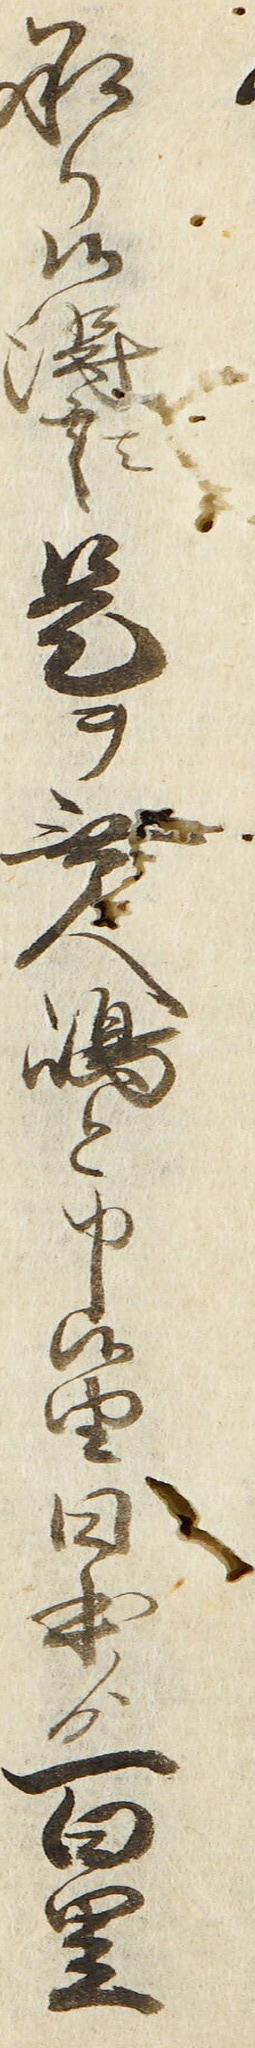承り候得者是ヲ無人嶋と申候由日本ゟ百里
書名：漂客談寄
